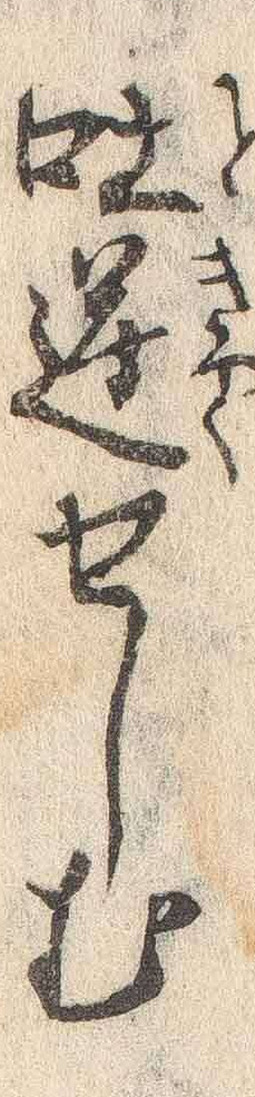吐逆せしむ
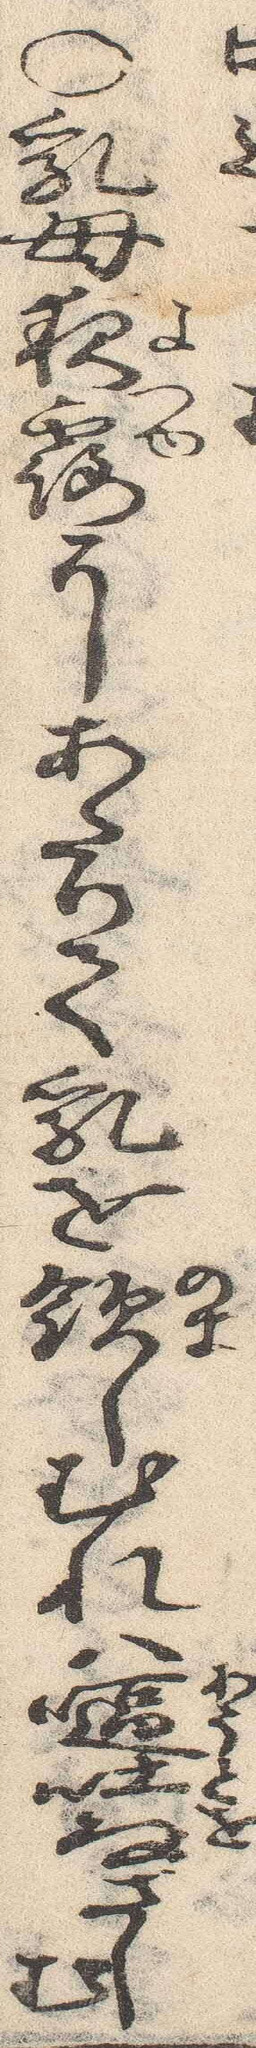◯乳母夜露にあたりて乳を飲しむれは嘔吐なさしむ
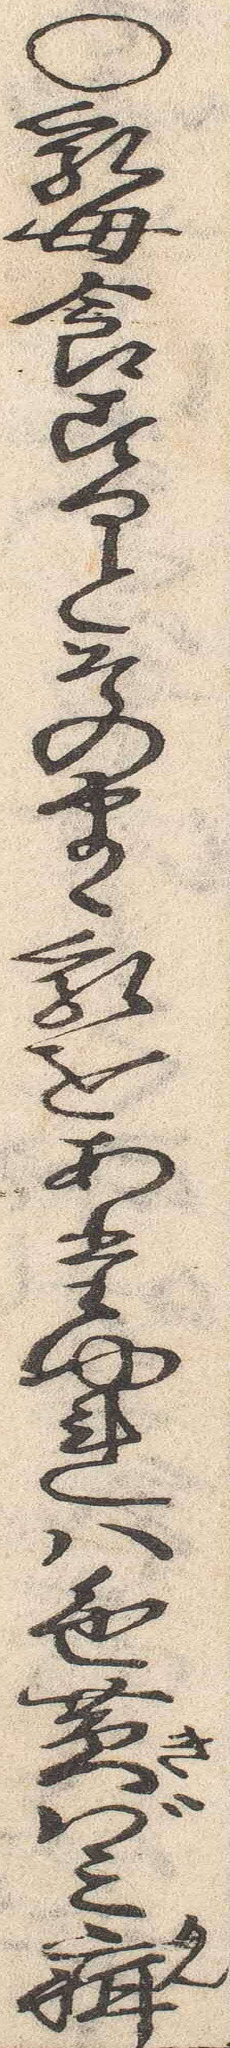◯乳母食するとそのまゝ乳をあたゆれは色黄ばみ疳
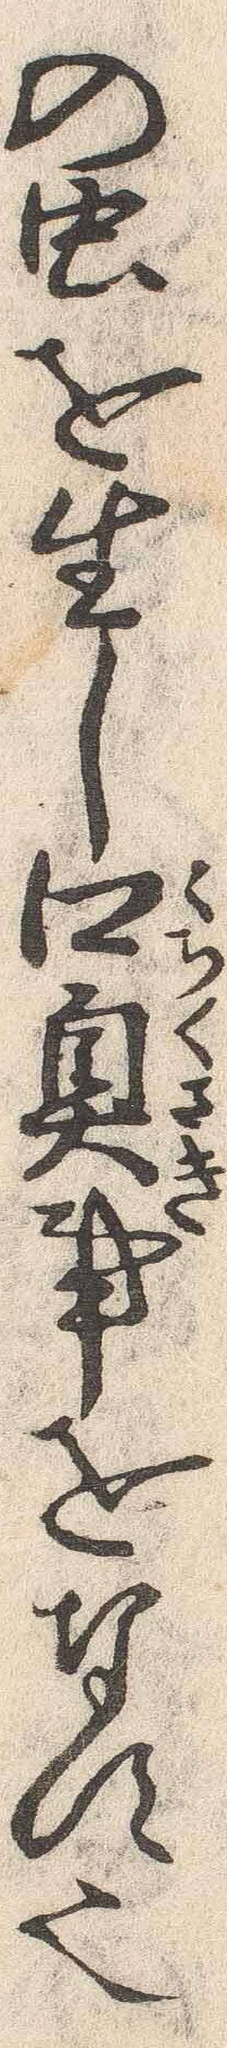の虫を生し口臭事をなす也
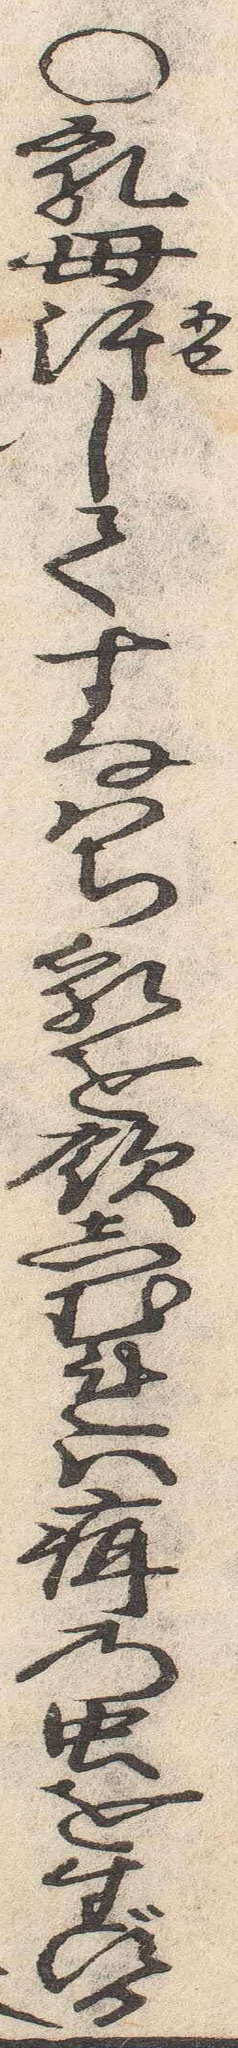◯乳母汗してすなはち乳を飲しむれは疳の虫を生ずる也
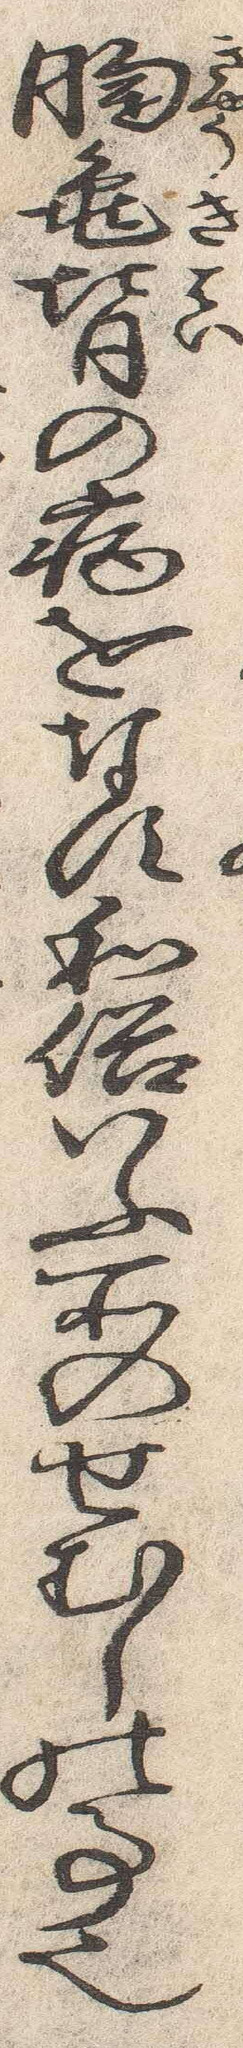胸亀背の病をなす和俗いふ所のせむしの事也
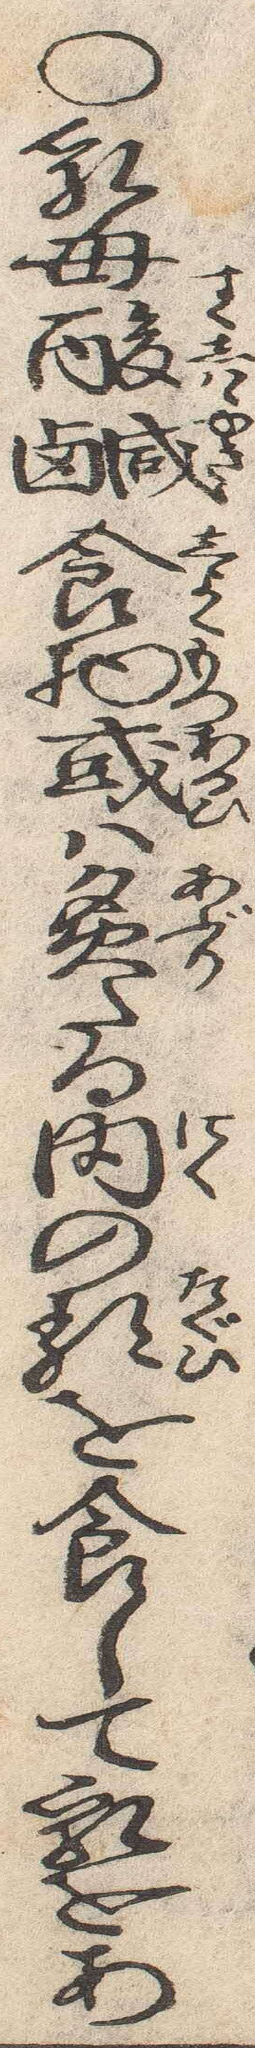◯乳母酸鹹食物或は炙たる肉の類を食して乳をあ
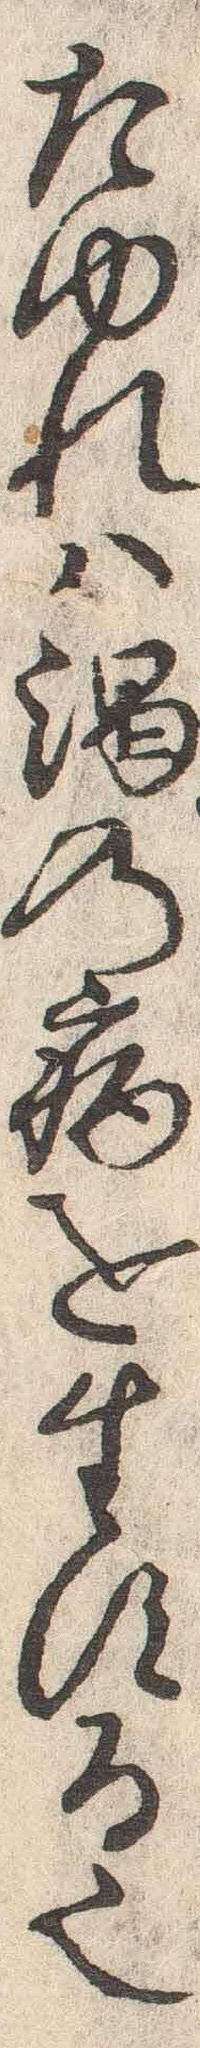たゆれは渇の病を生する也
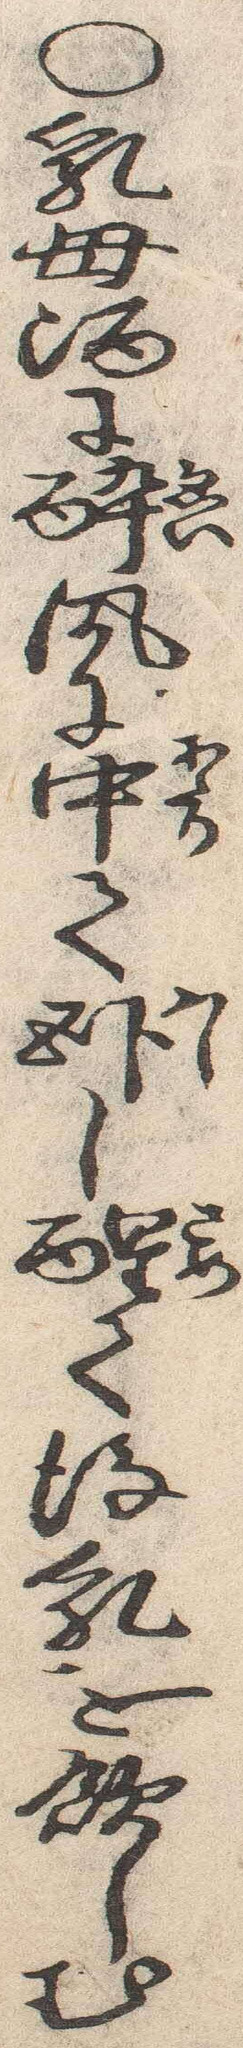◯乳母酒に酔風に中て臥し醒て後乳を飲しむ
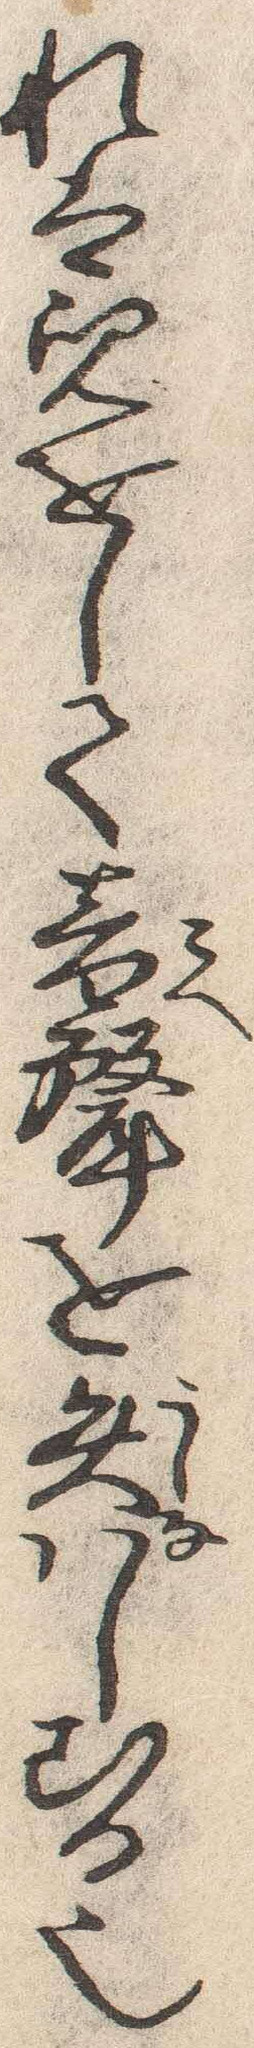れは児をして音聲を失はしむる也
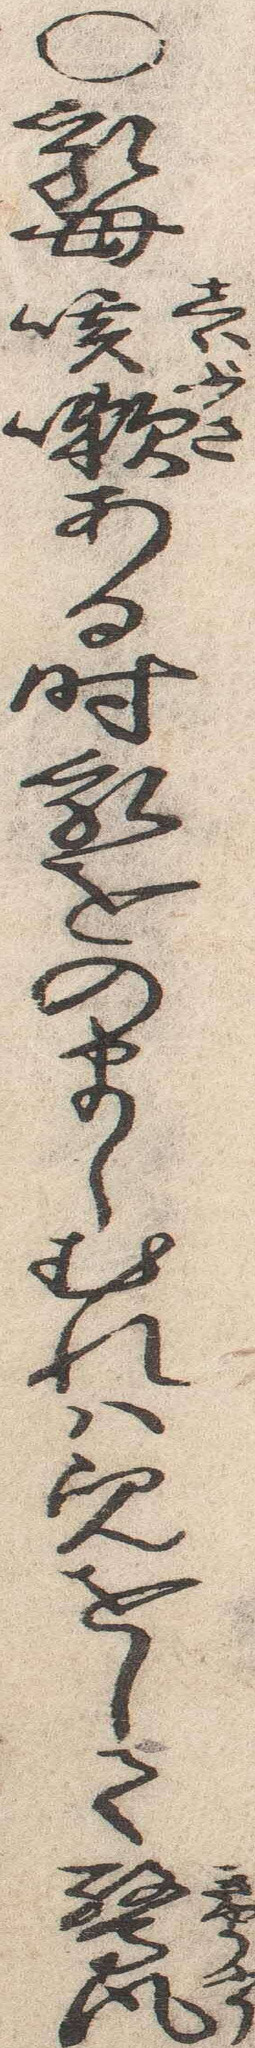◯乳母咳嗽のある時乳をのましむれは児をして驚風
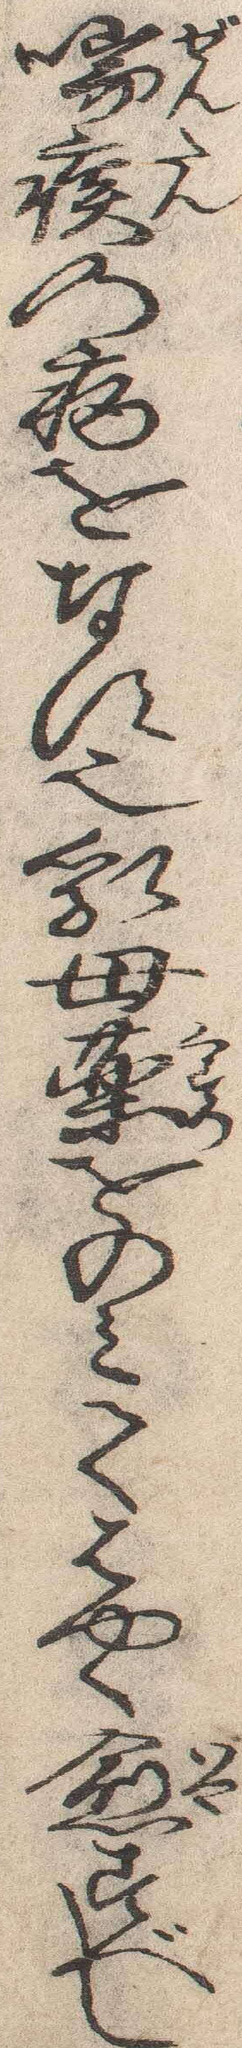喘痰の病をなす也乳母薬をのみてはやく愈すべし

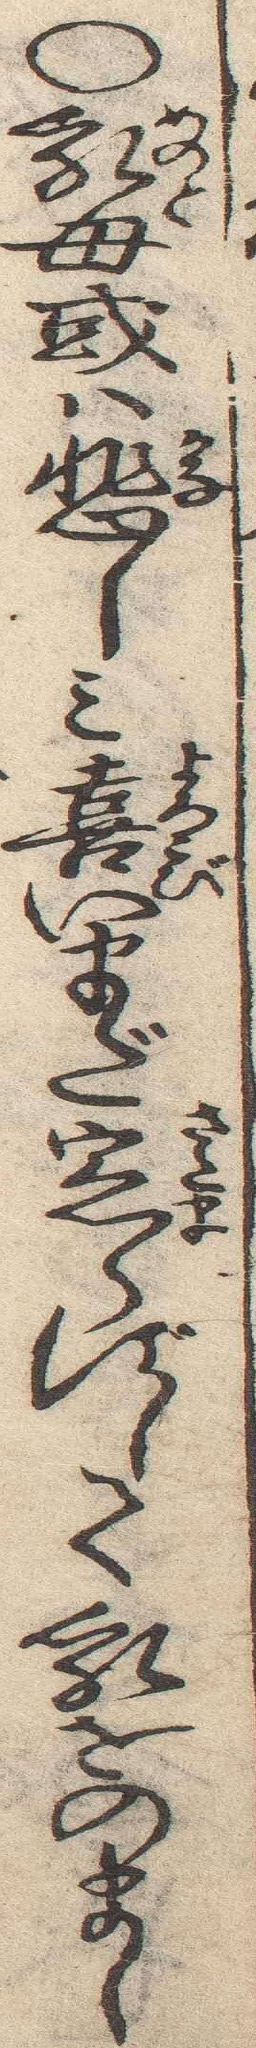◯乳母或は悲しみ喜いまだ定らずして乳をのまし
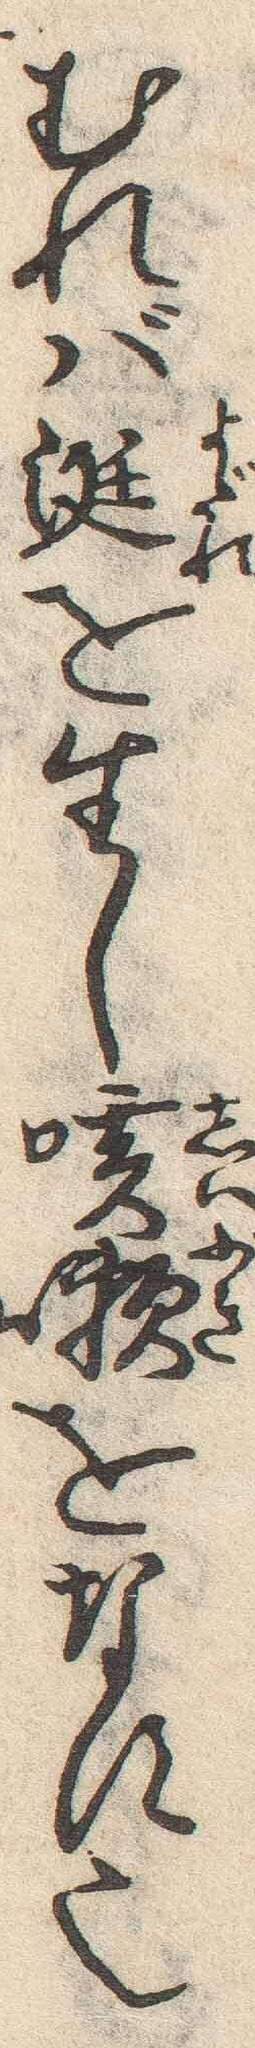むれば涎を生し咳嗽をなす也
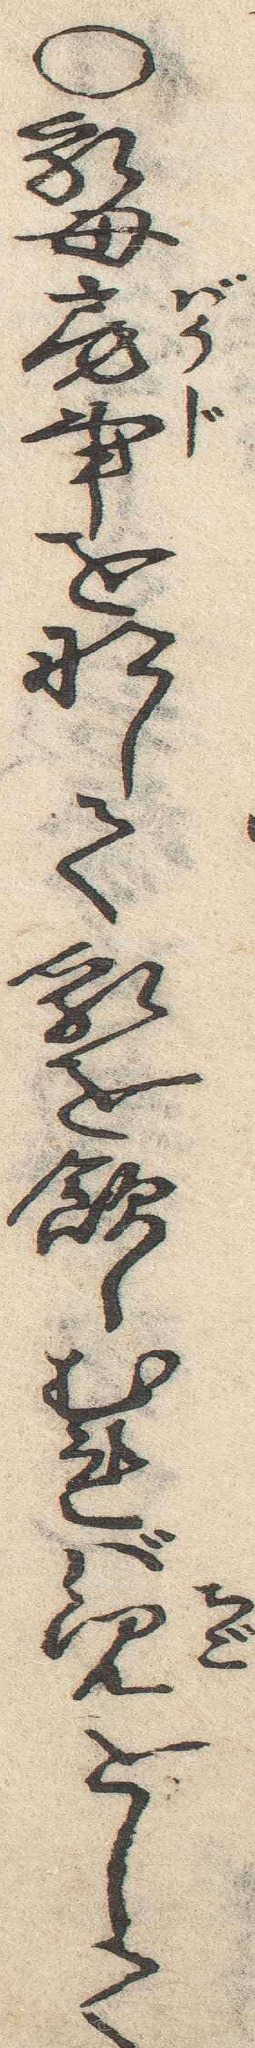◯乳母房事をなして乳を飲しむれば児をして
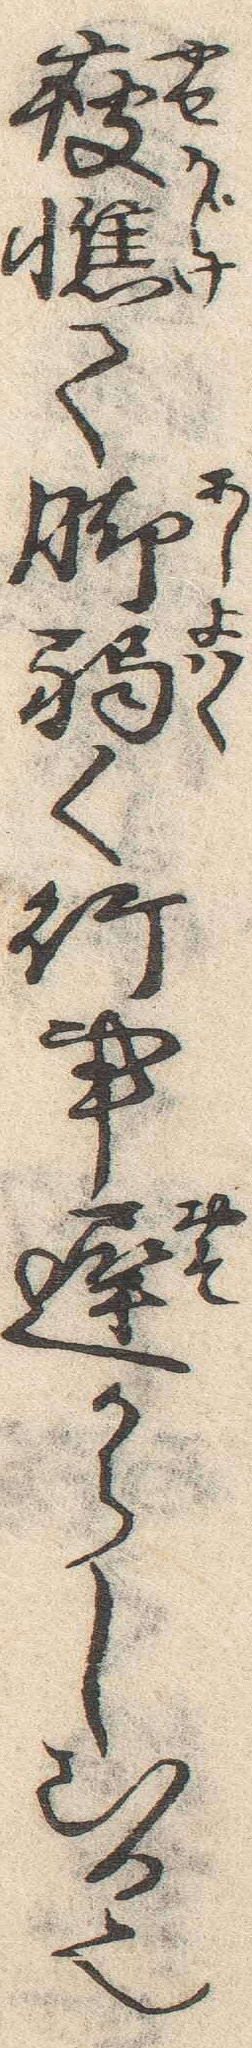痩憔て脚弱く行事遅からしむる也
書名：小児必用養育草
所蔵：東京学芸大学附属図書館 国文学研究資料館
